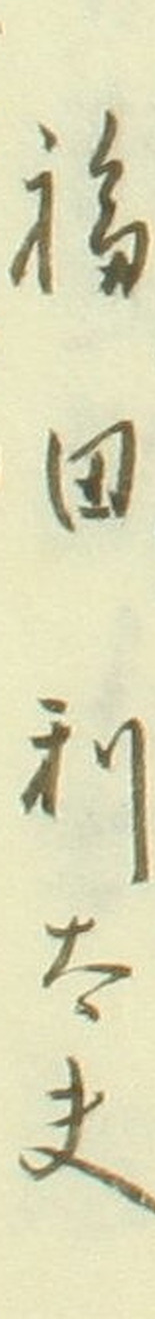福田利太夫
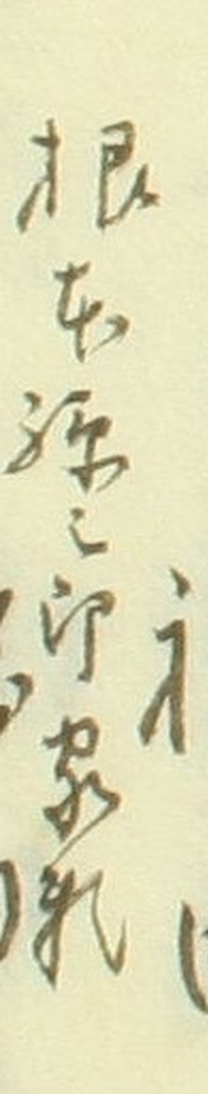同根本源三郎家頼
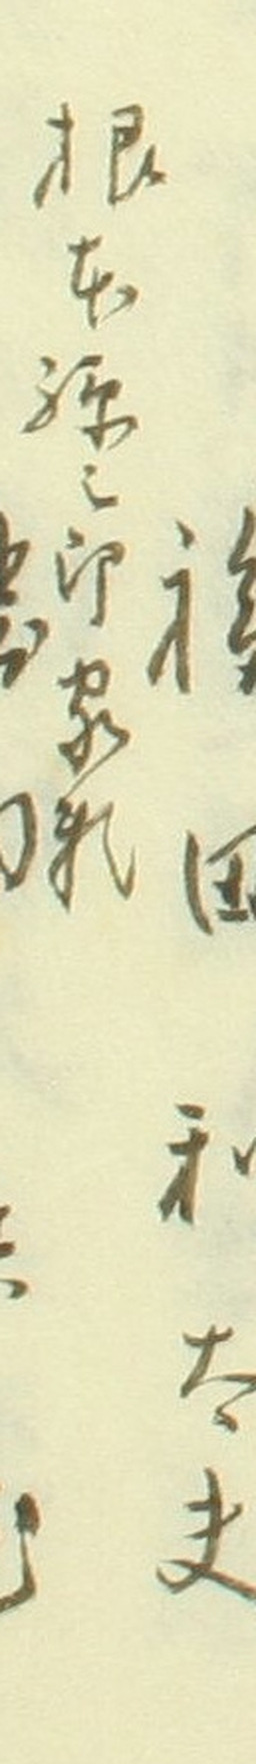同根本源三郎家頼
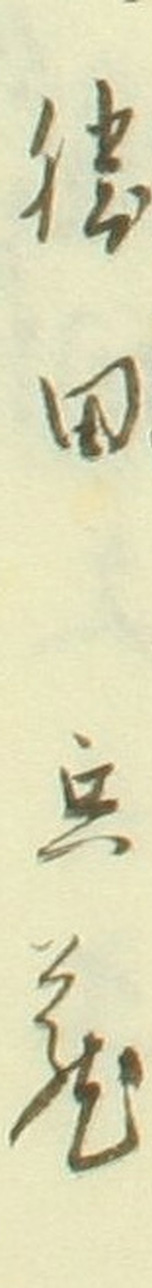福田兵蔵
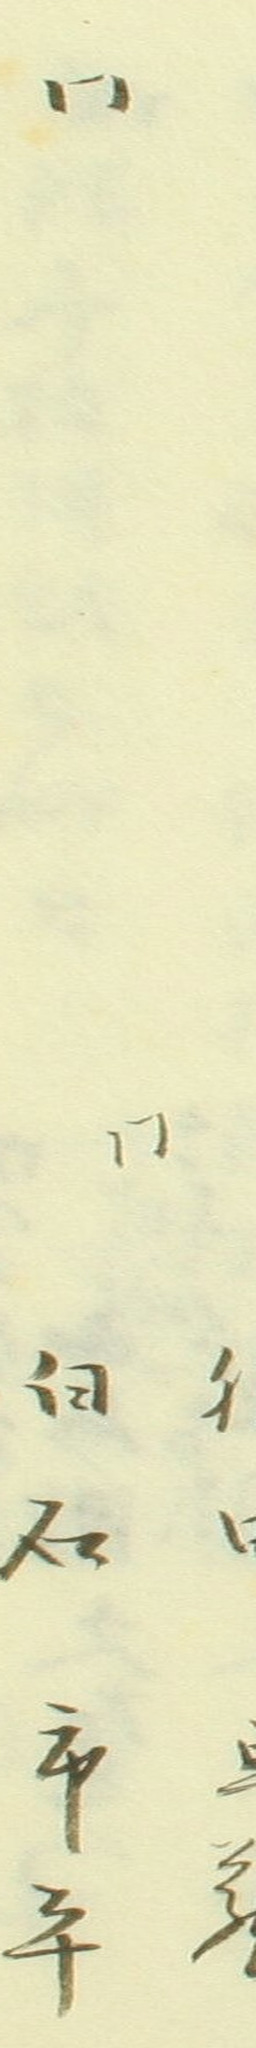同同白石市平
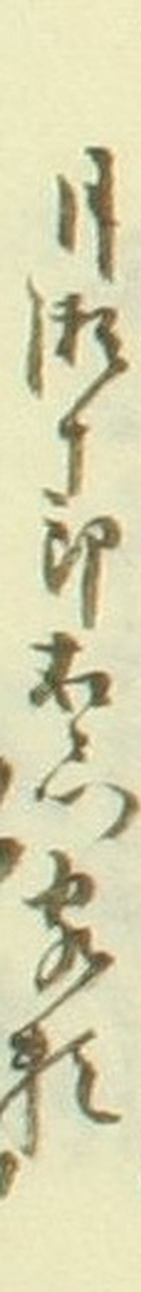同月瀬十郎右衛門家頼
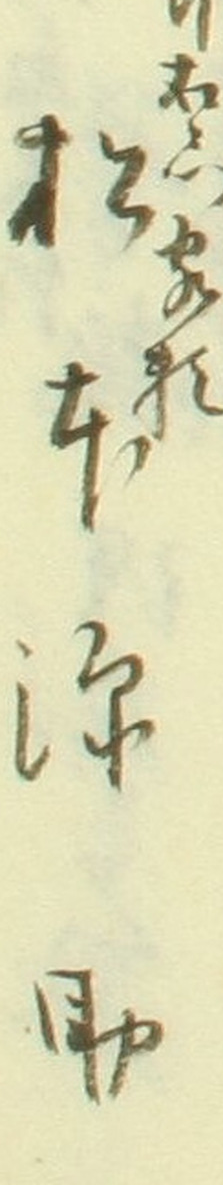松本源助
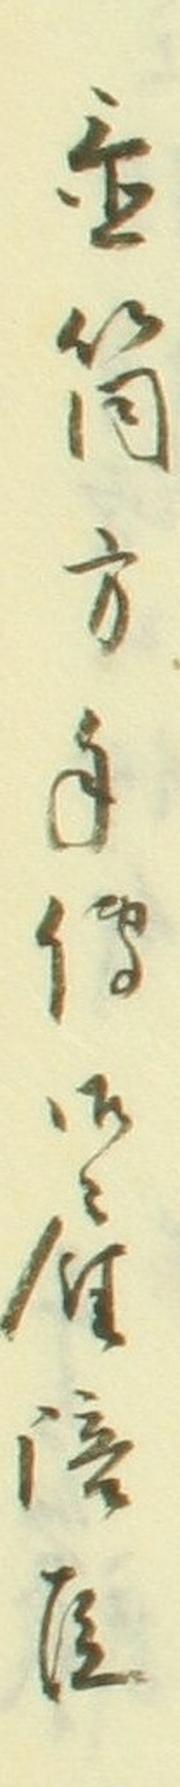置筒方手伝御雇陪臣

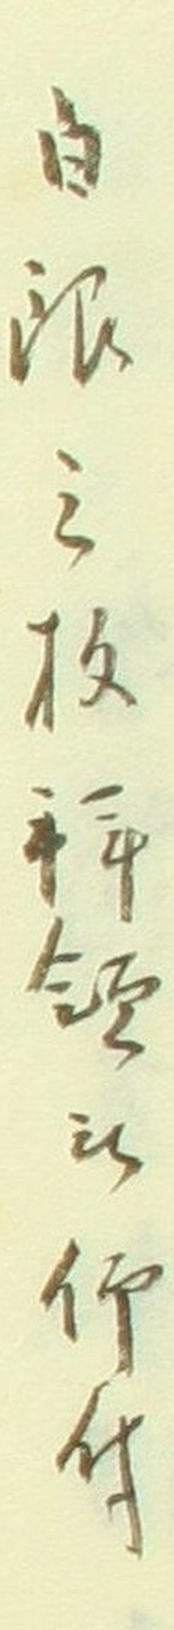白銀壱枚拝領被仰付
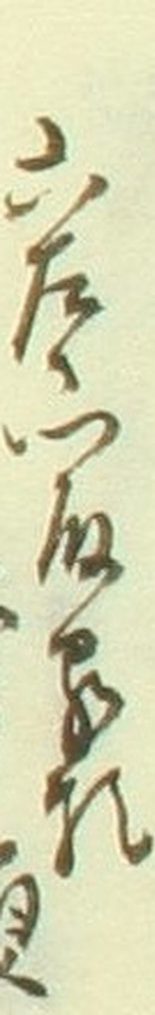同六左衛門殿家頼
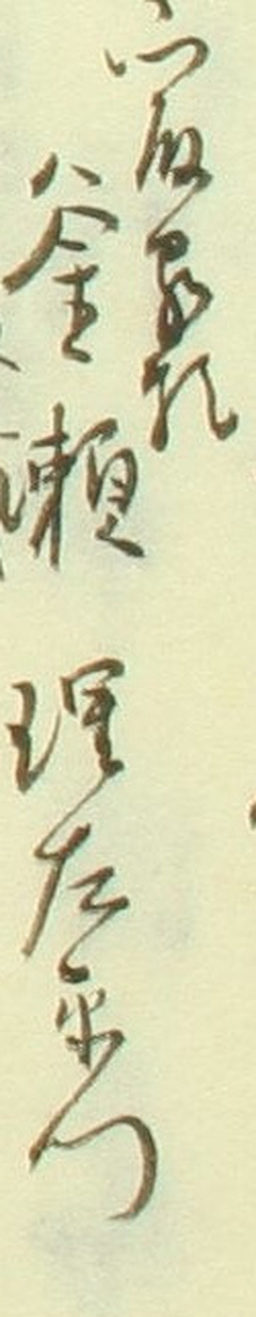釜瀬理左衛門
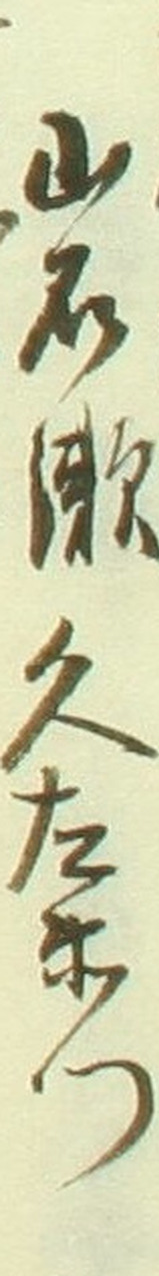山名瀬久左衛門
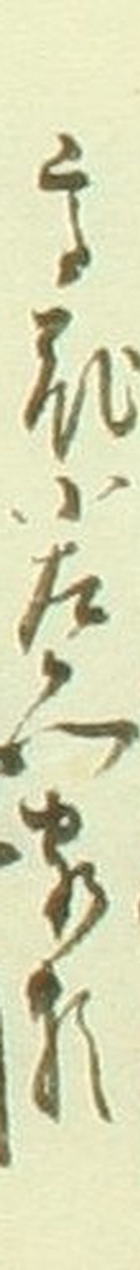同高？小左衛門家頼
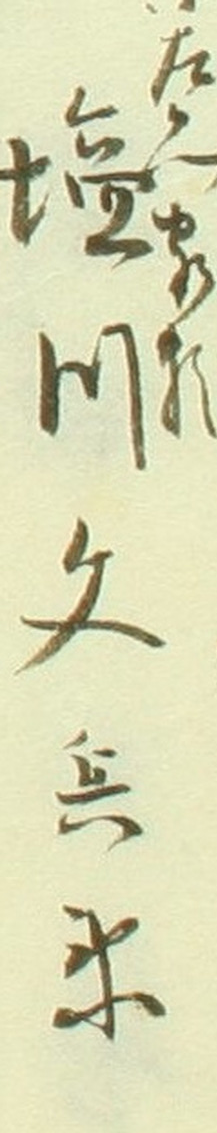塩川文兵衛
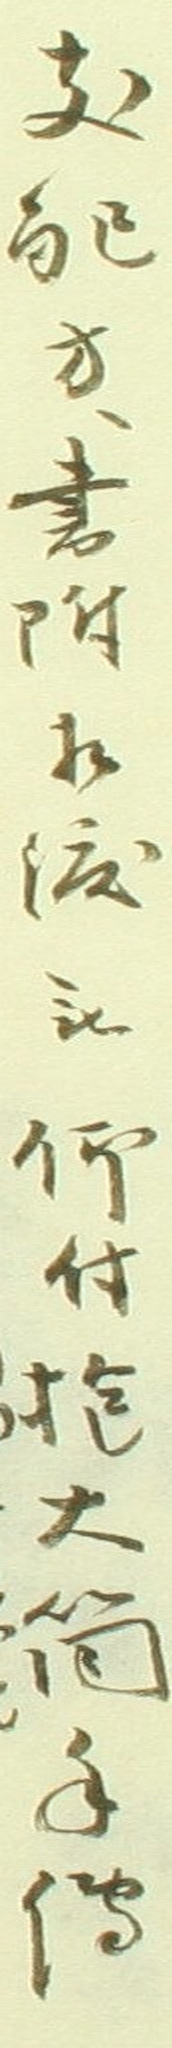支配方へ書附相渡被仰付抱大筒手伝
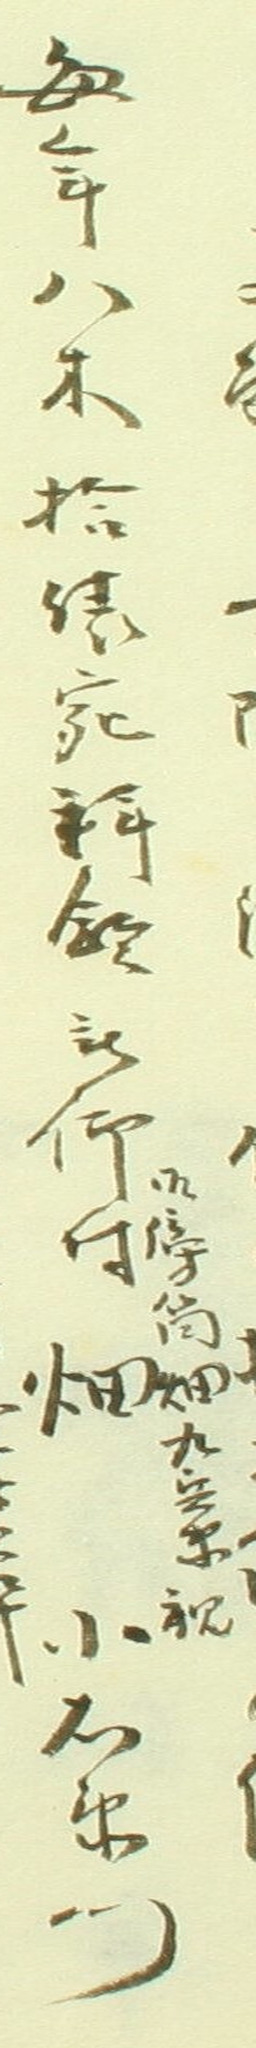毎年八木拾俵宛拝領被仰付御傍筒畑九兵衛親
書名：唐船漂流記 三
